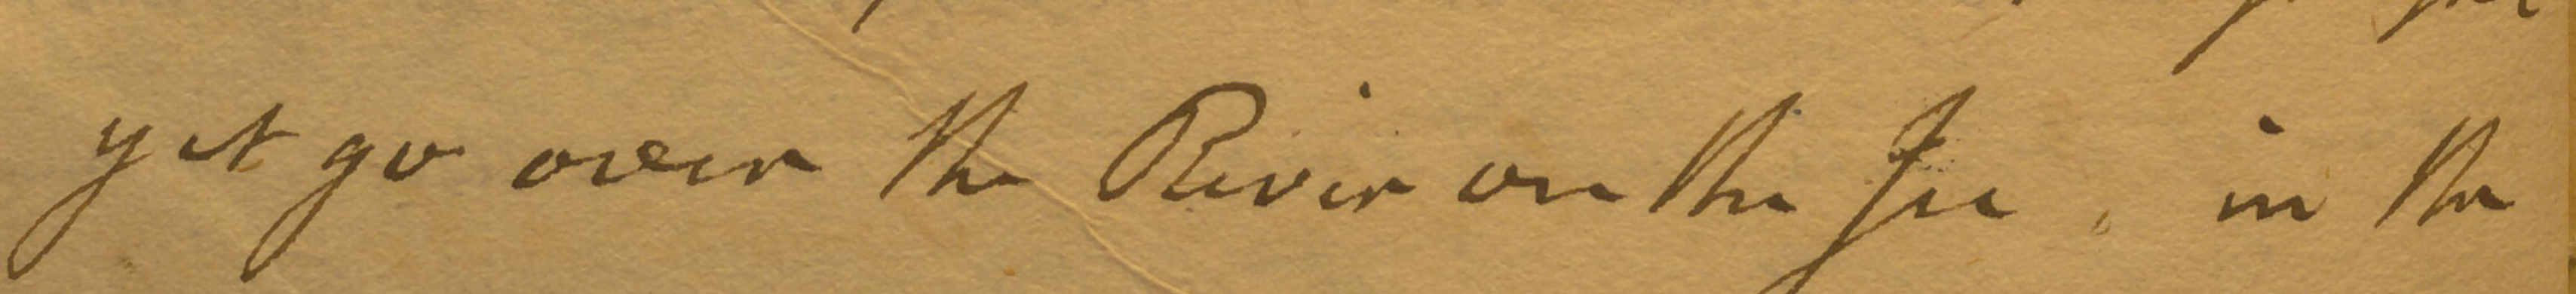yet go over the River on the Ice, in the
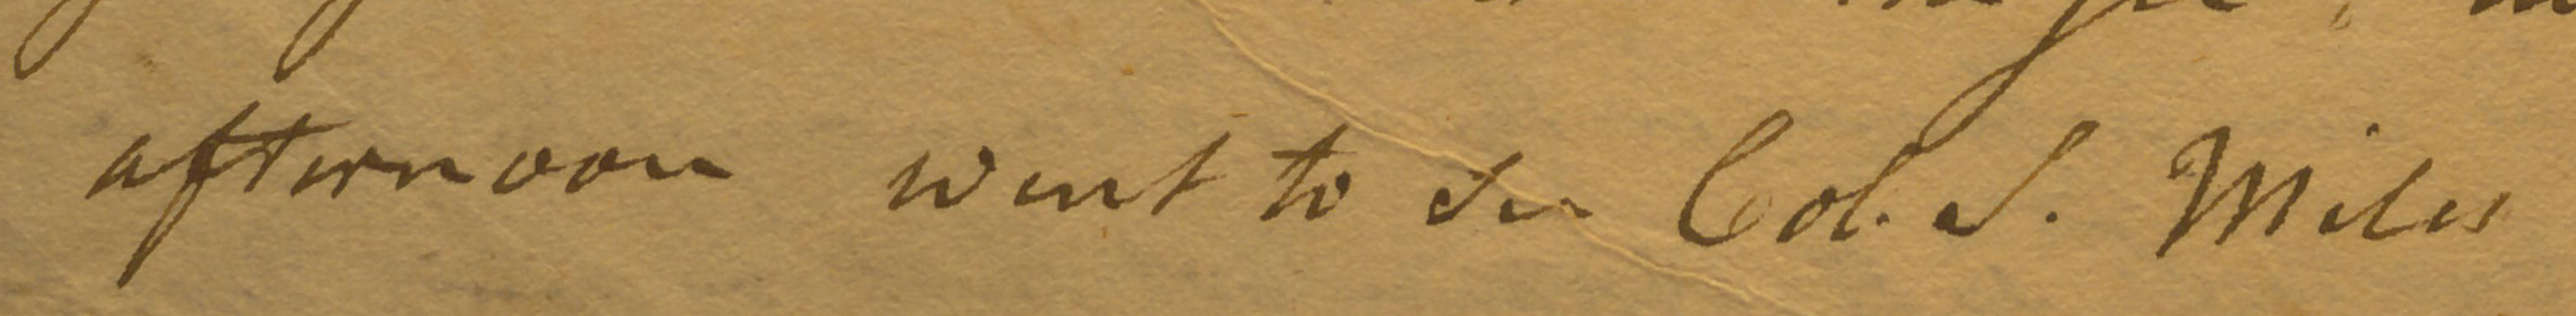afternoon went to see Col. S. Miles
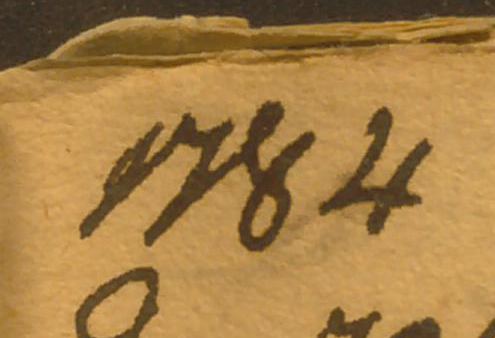1784
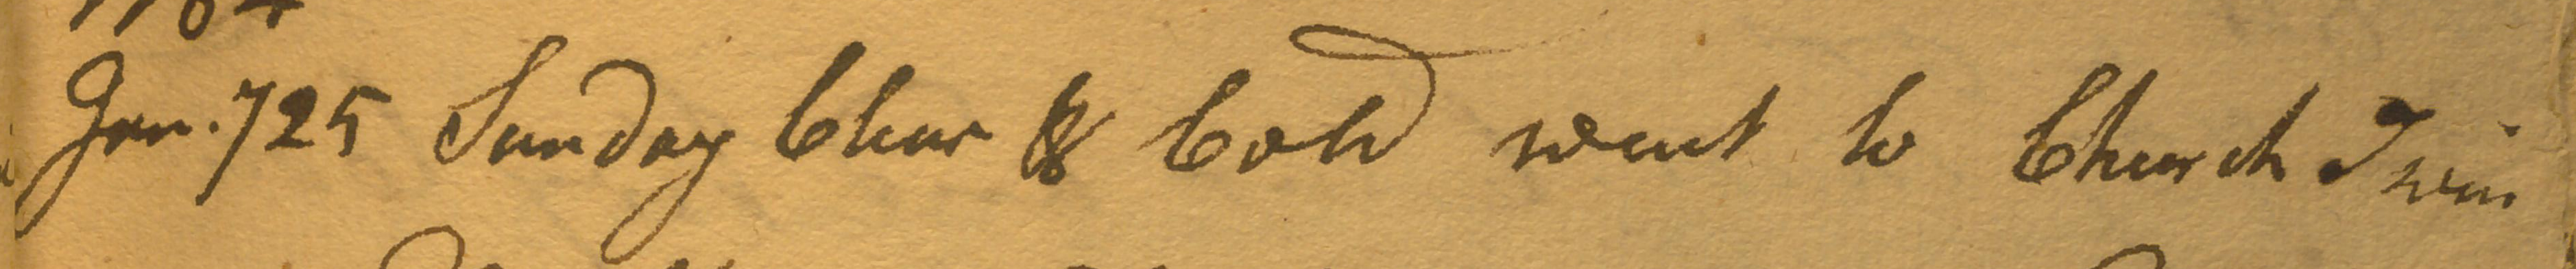Jan^y. 25 Sunday Clear & Cold went to Church Twice
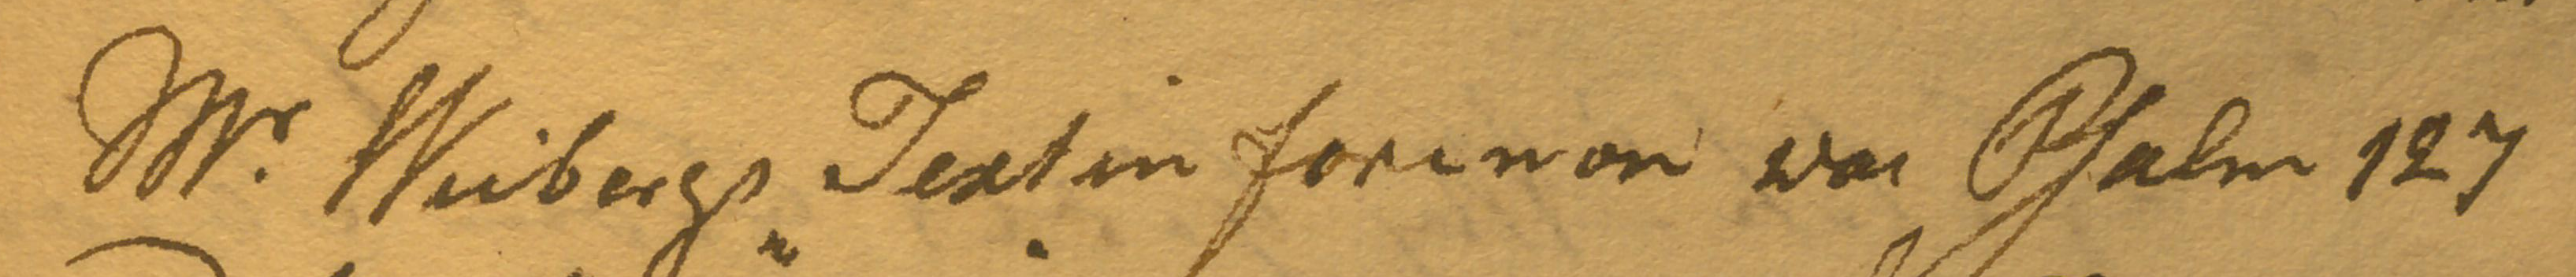M^r. Weibergs Text in forenon was Psalm 127
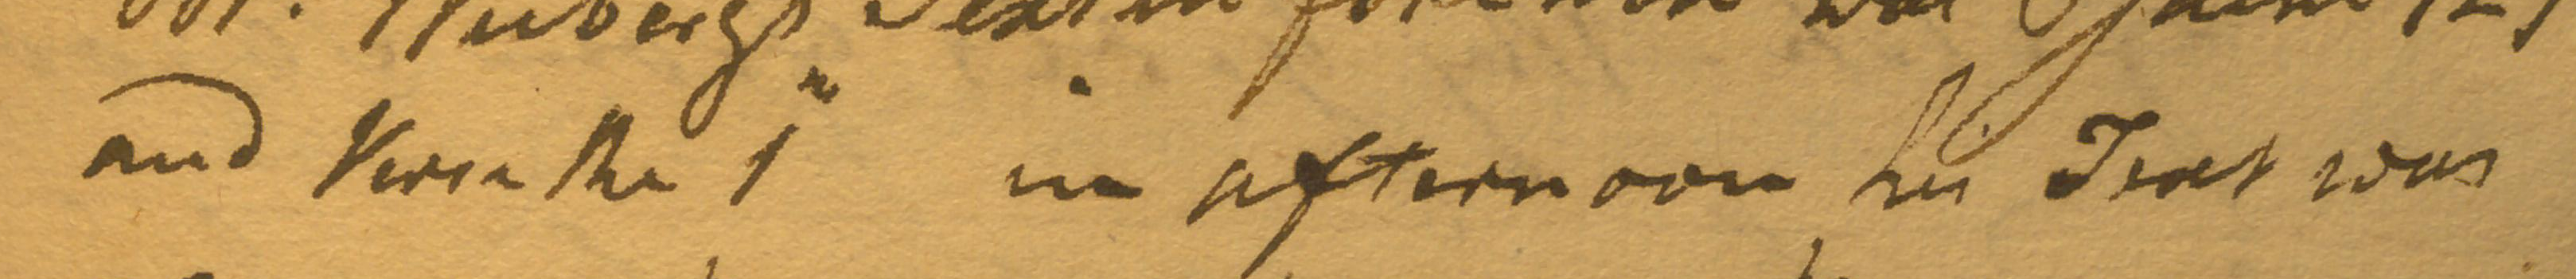and Verse the 1^th in afternoon his Text was
